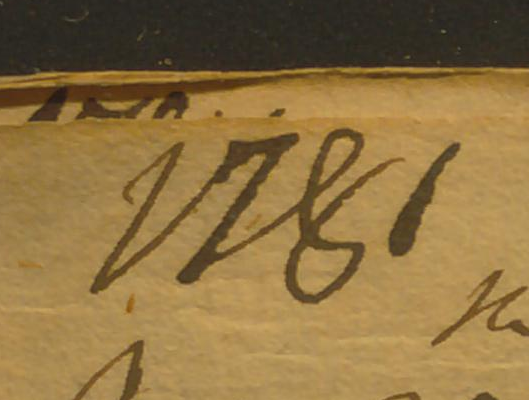1781
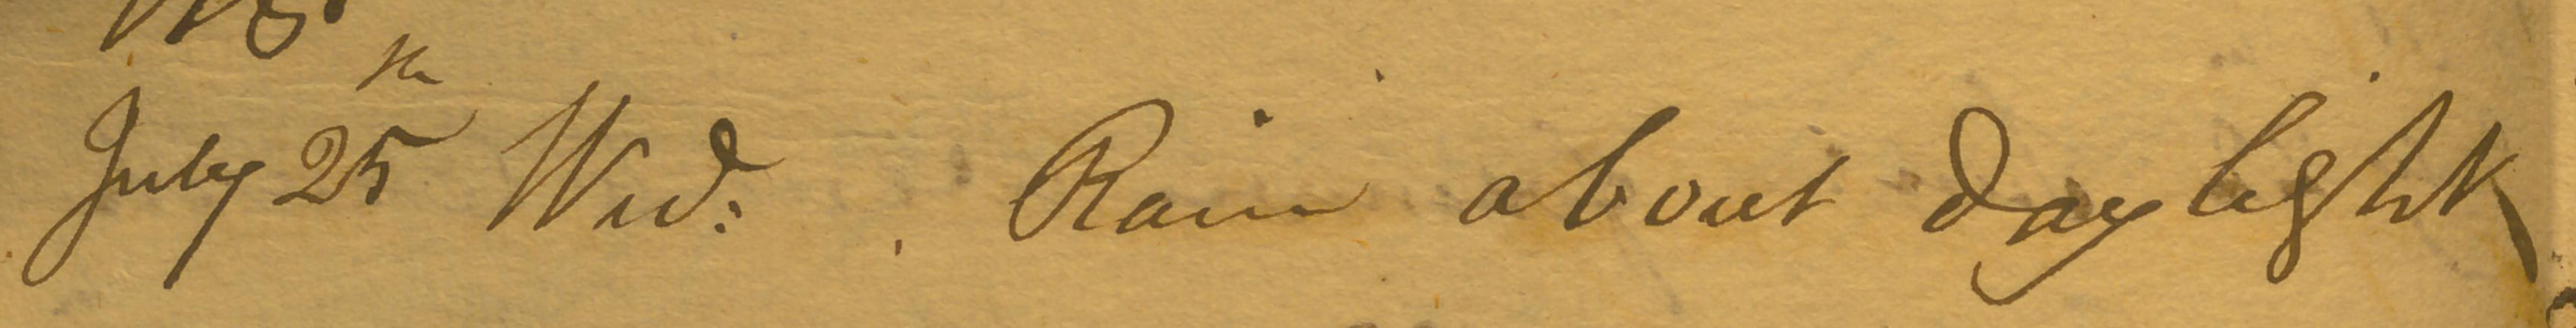July 25^th Wed. Rain about day light
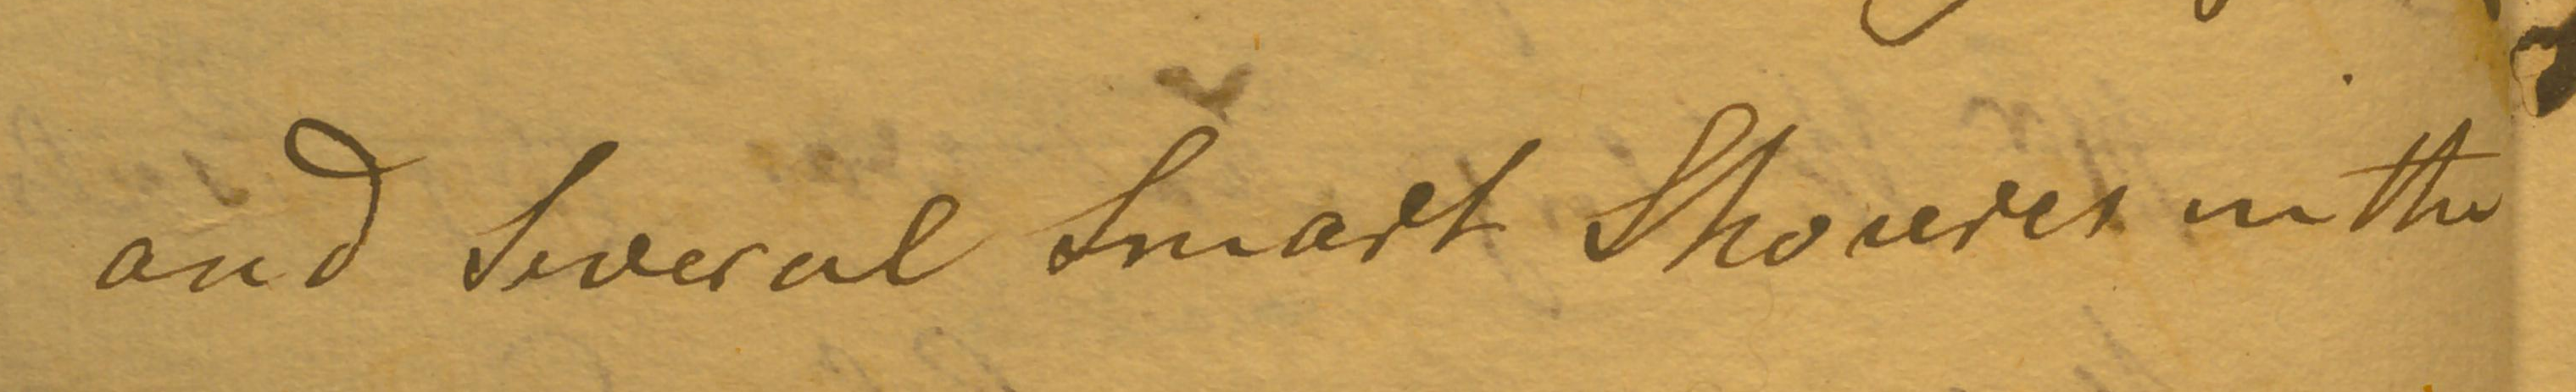and Several smart Shoures in the
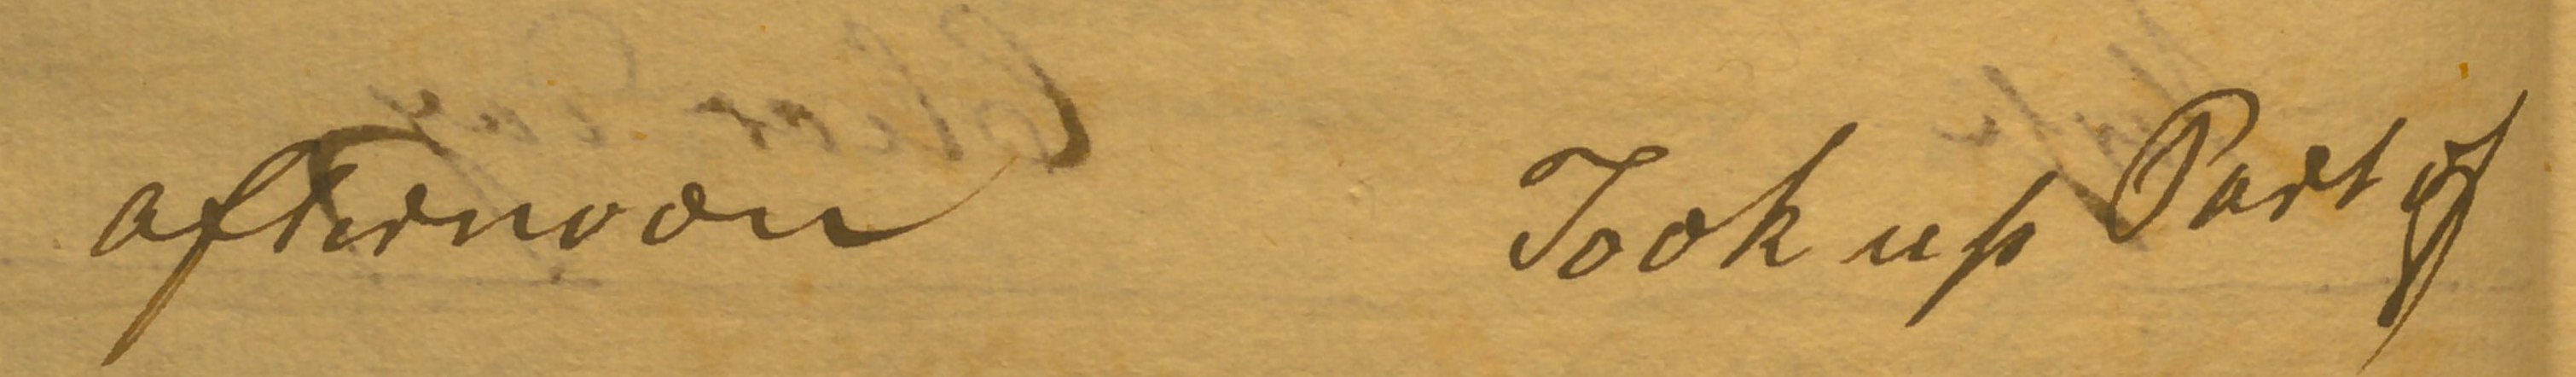afternoon- Took up Part of
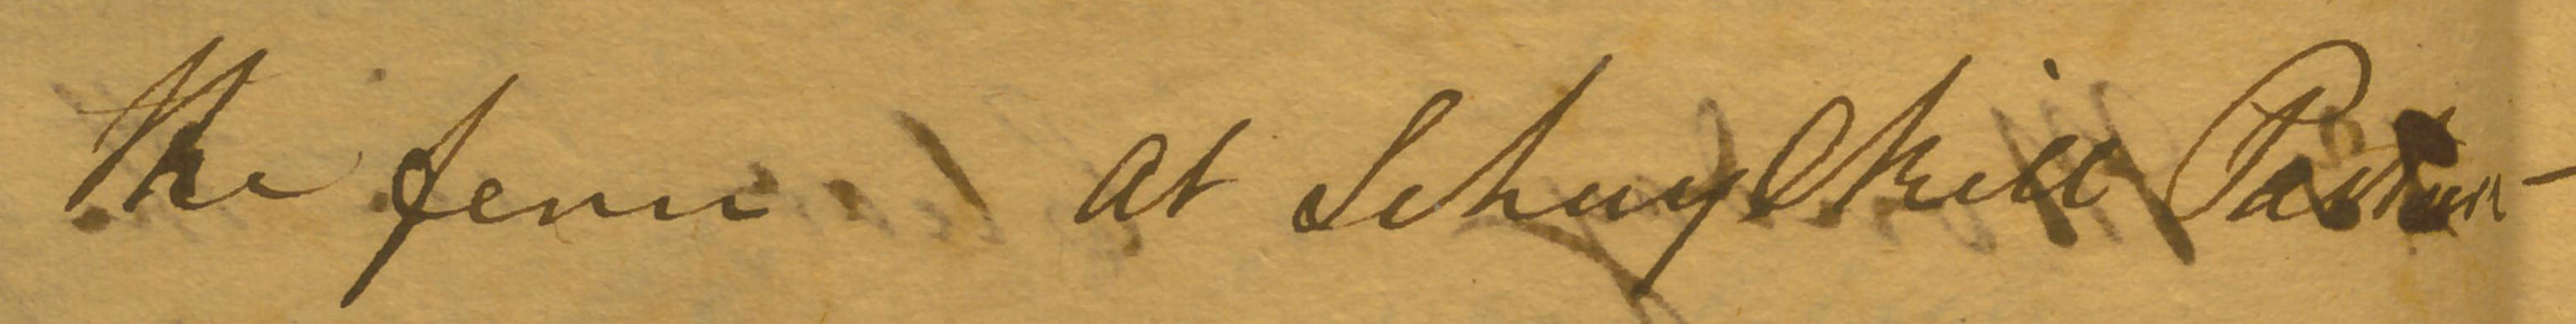the fence At Schuylkill Pasture
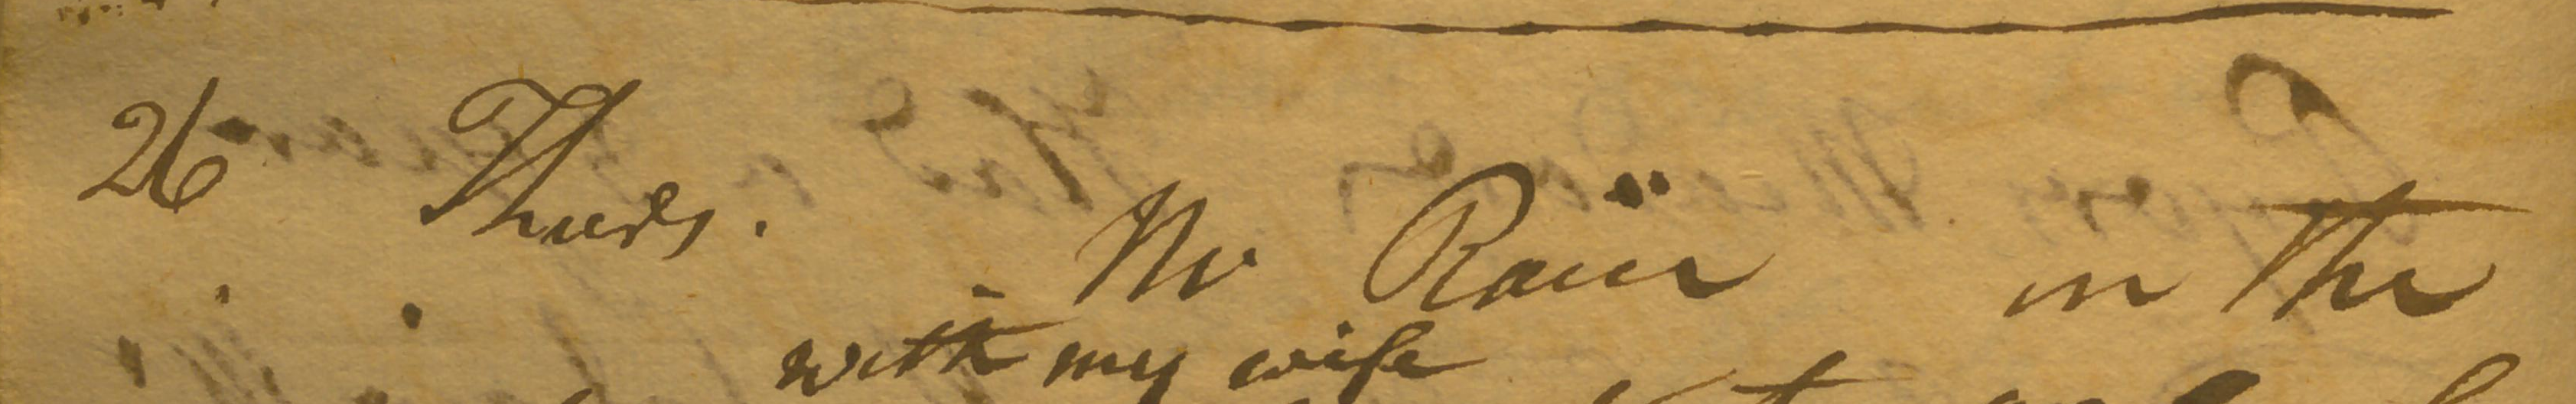26 Thurs. No Rain in the
